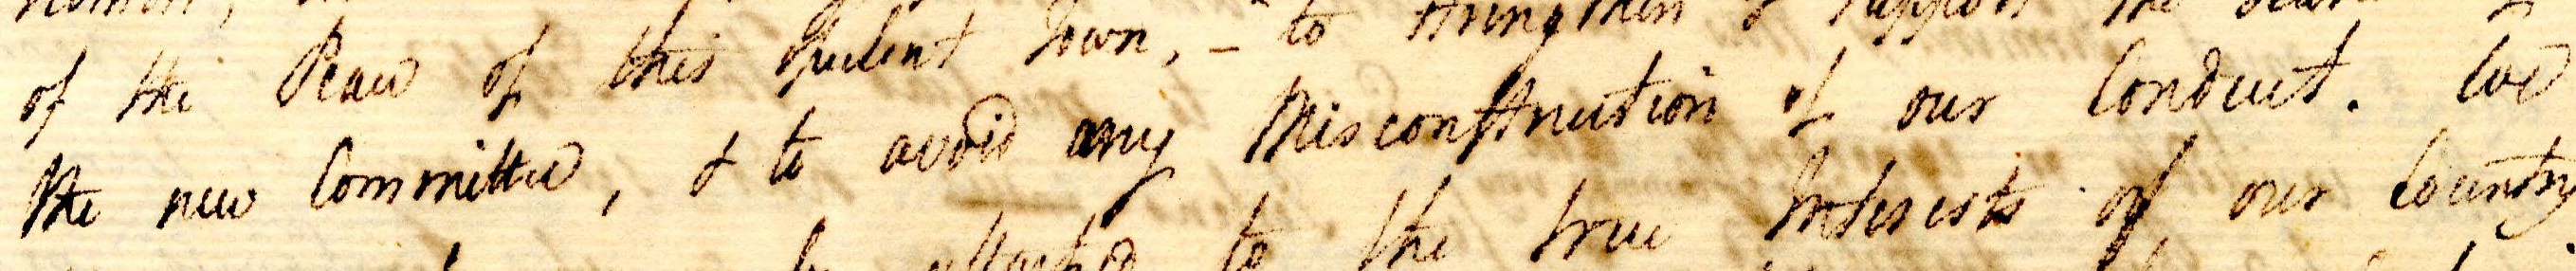the new Committee, & to avoid any Miscontinution of our Conduct. We
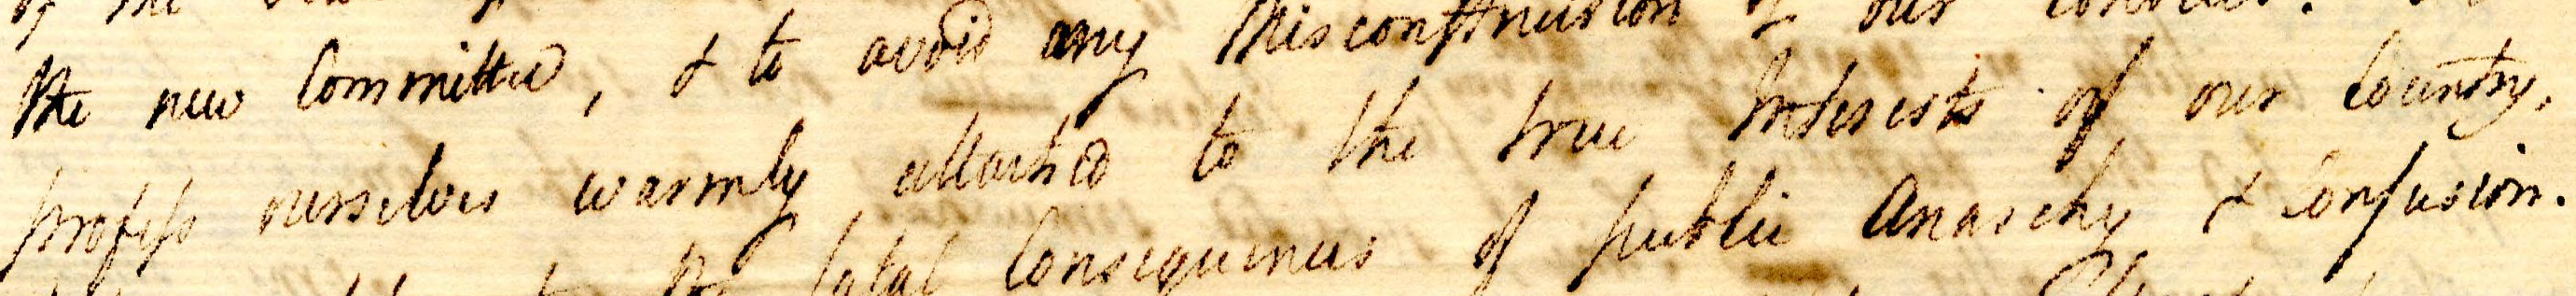profess ourselves warmly attuned to the true Interest of our Country,
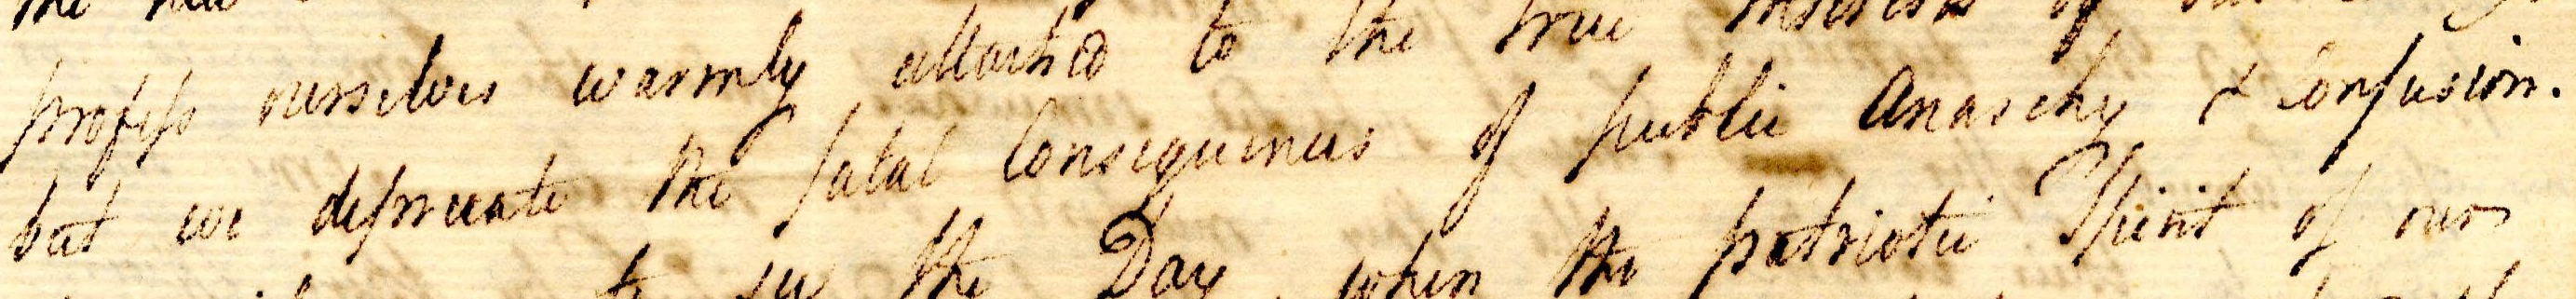but we desnuate the fatal Consequences of public Anarchy & confusion
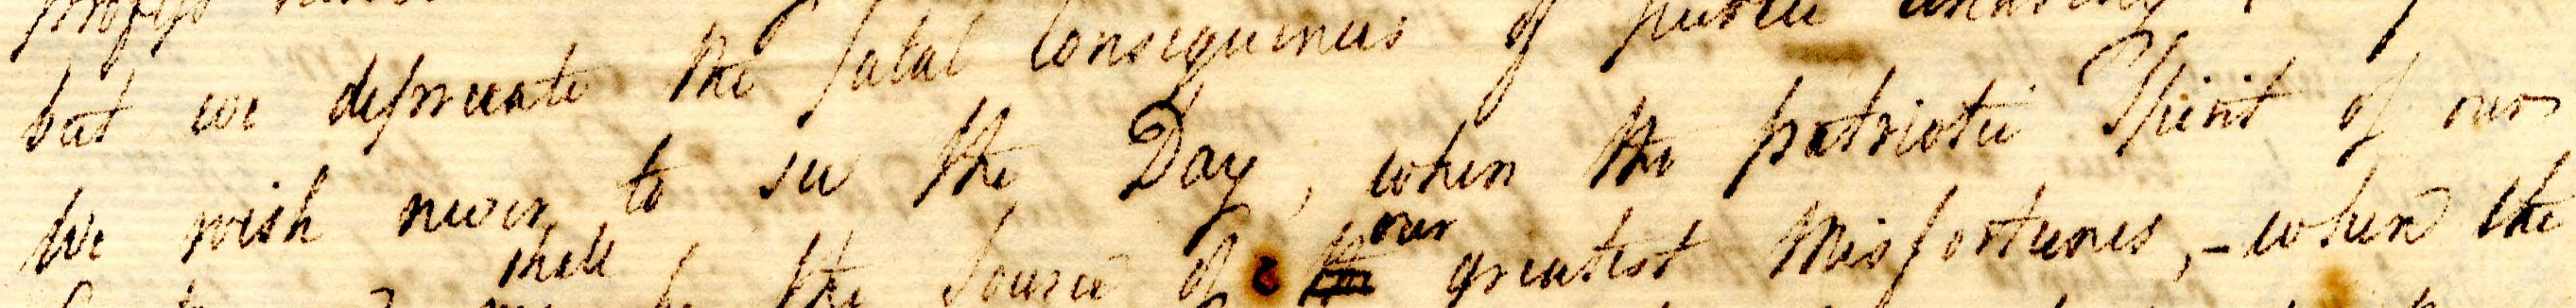We wish never to see the Day, when the patriotic Spirit of our
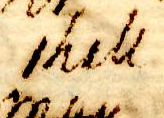shall
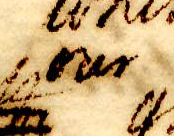our
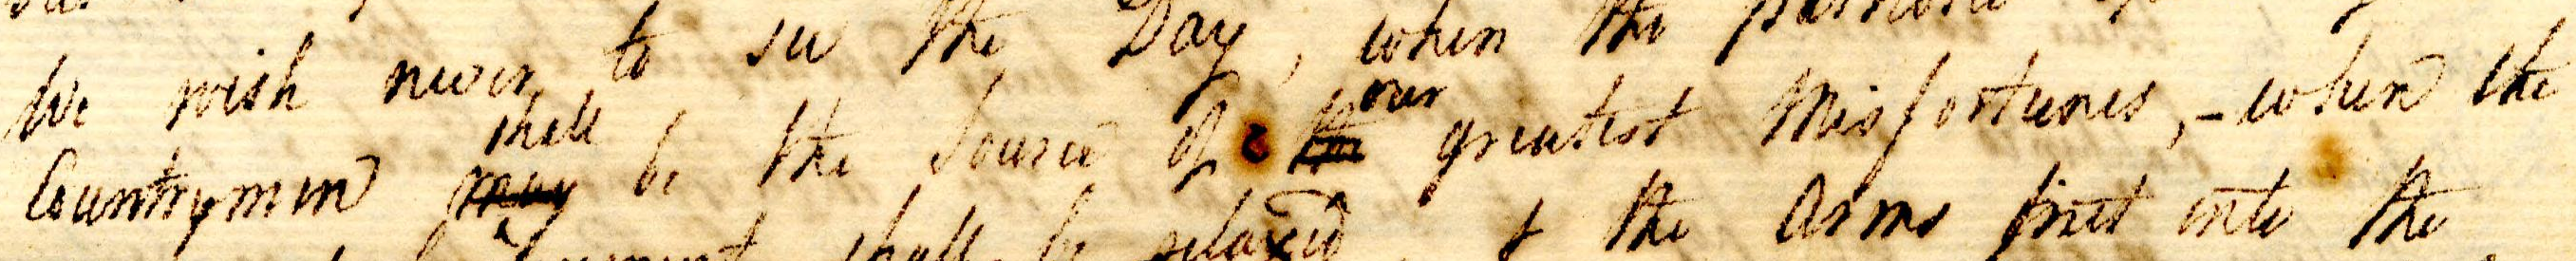Countrymen may ^ be the Source of the ^ greatest Misfortunes, when the
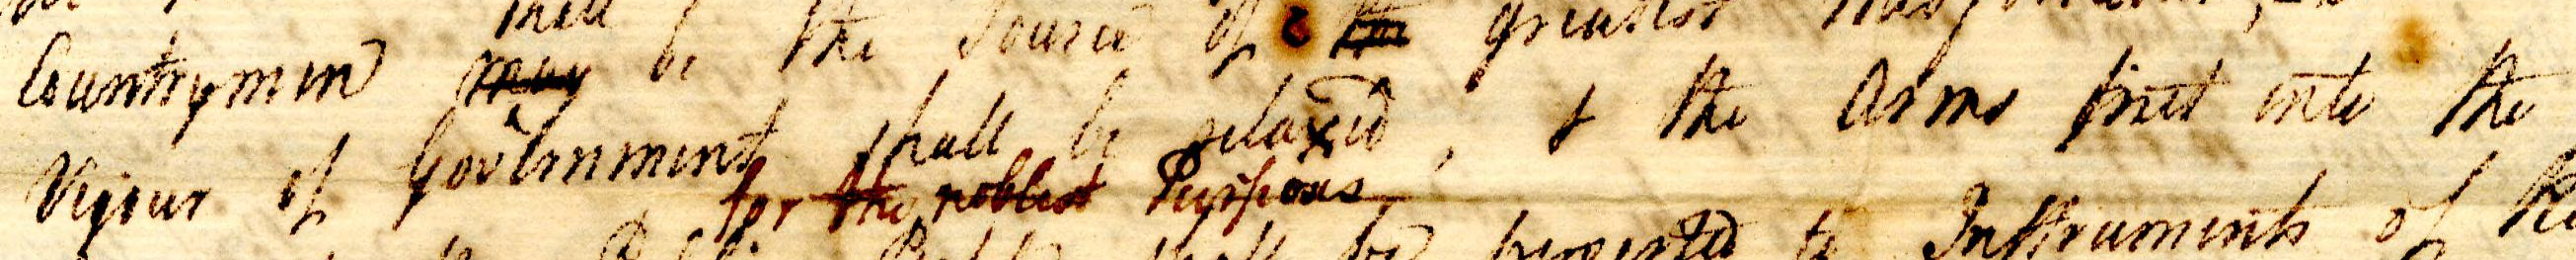Vigour if Government shall be relaxed, & the Arms thrust into the
